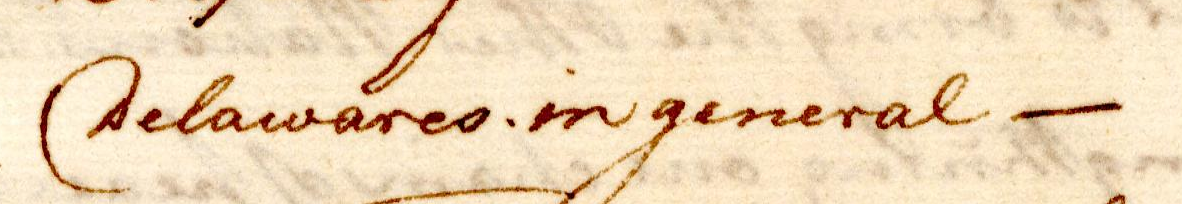Delawares in general-
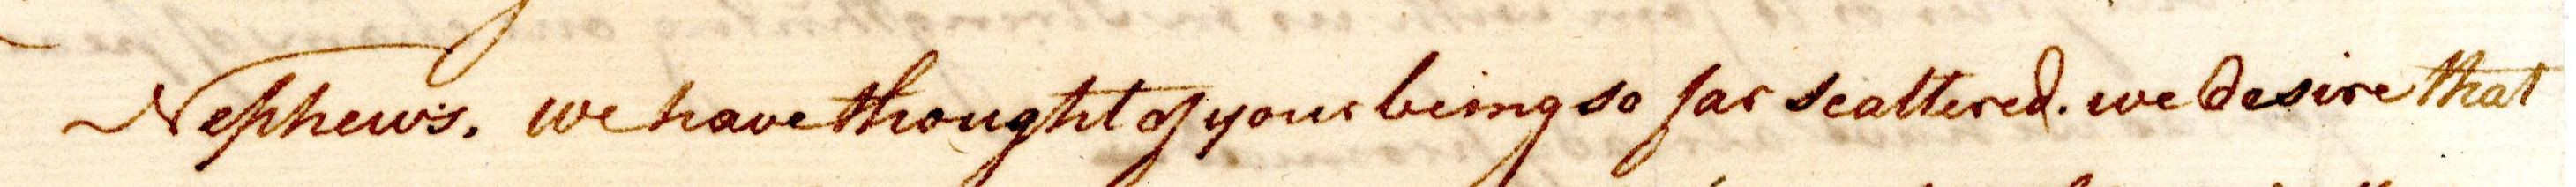Nephews, we have thought of your being so far scattered. we desire that
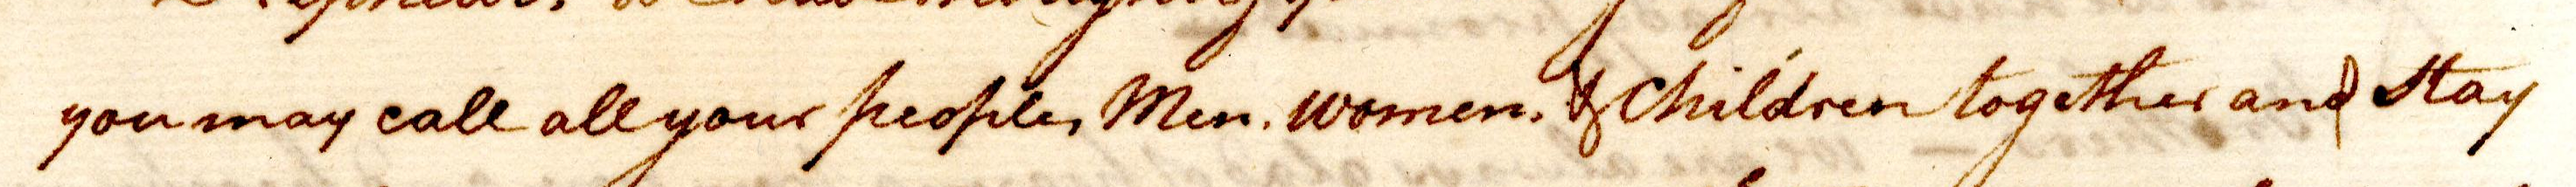you may call all your people, Men, Women, & Children together and Stay
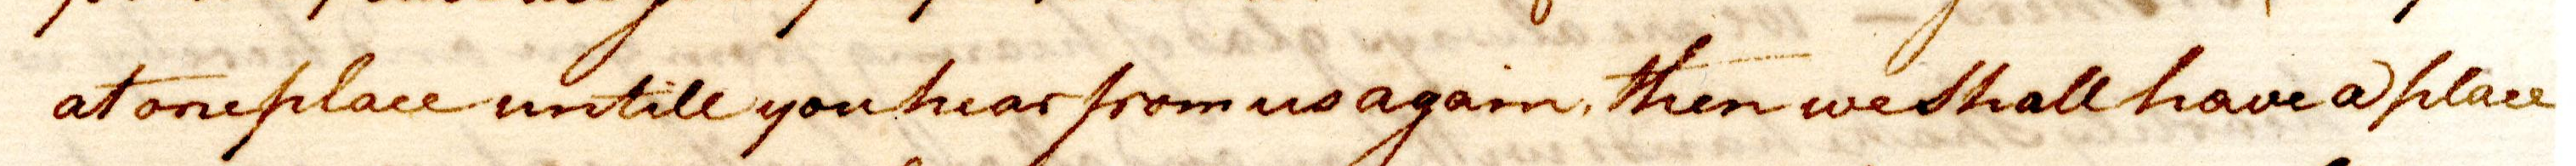at one place untill you hear from us again, then we shall have a place
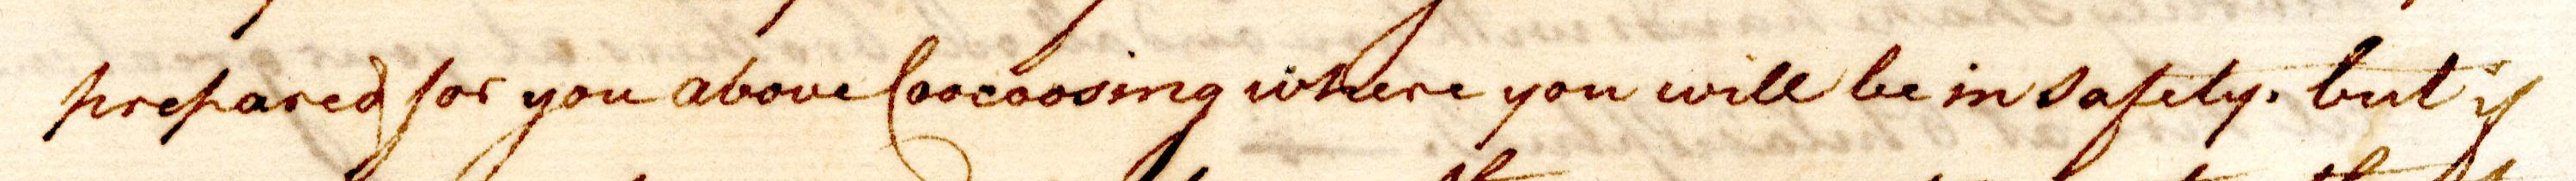prepared for you above Coocoosing where you will be in safety, but if
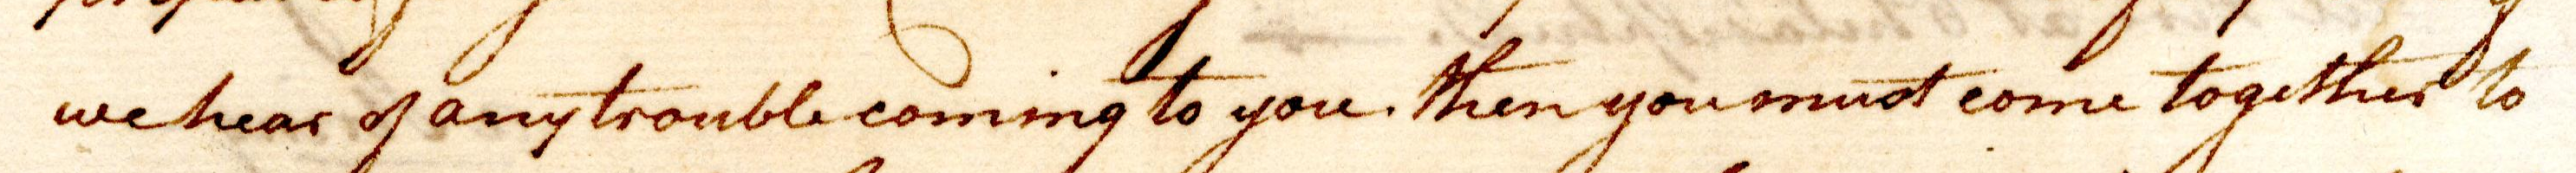we hear of any trouble coming to you. then you must come together to
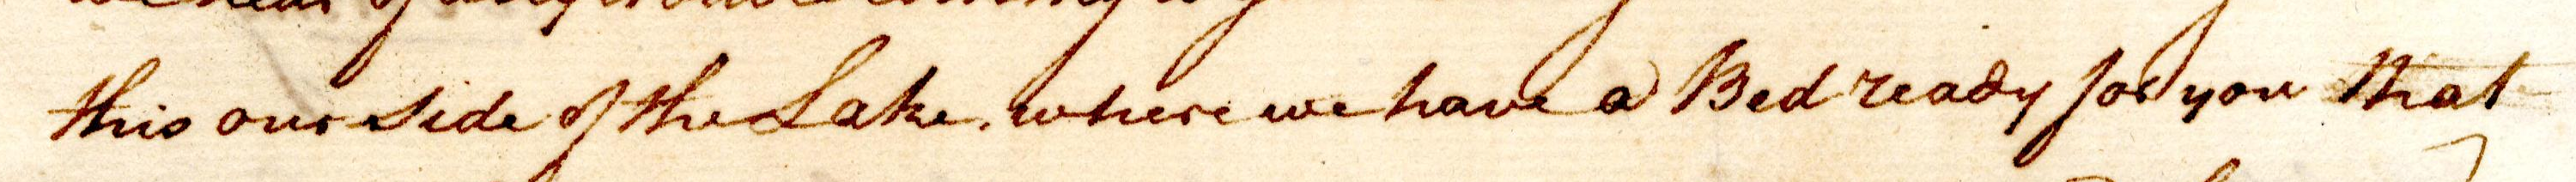this our side of the Lake, where we have a Bed ready for you that
